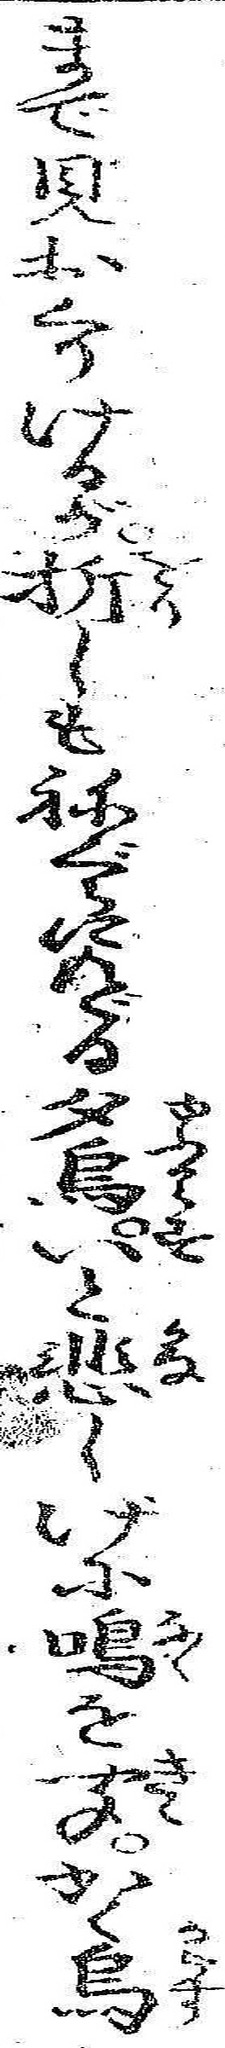まで見おくりけるが。折しもねぐらにもぐる夕烏。いと悲しげに鳴を聞。かく烏
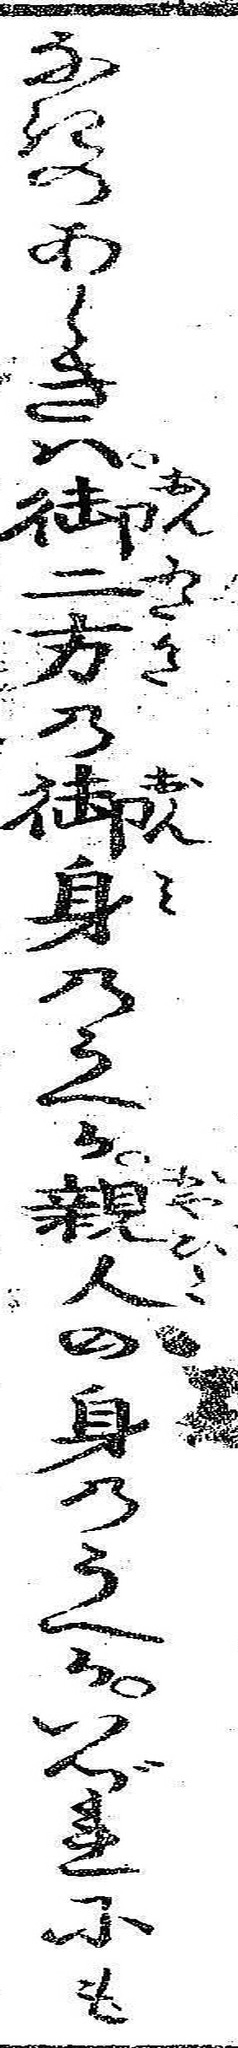なきのあしきは。御二方の御身のうへか。親人の身のうへか。いづれにも
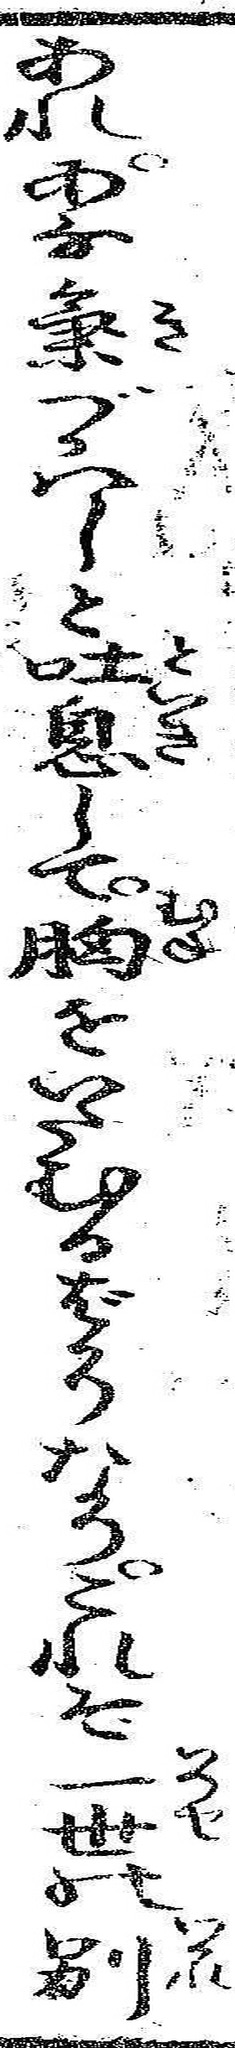あれ。あな気づかはしと吐息して。胸をいたむるばかりなり。これぞ一世の別
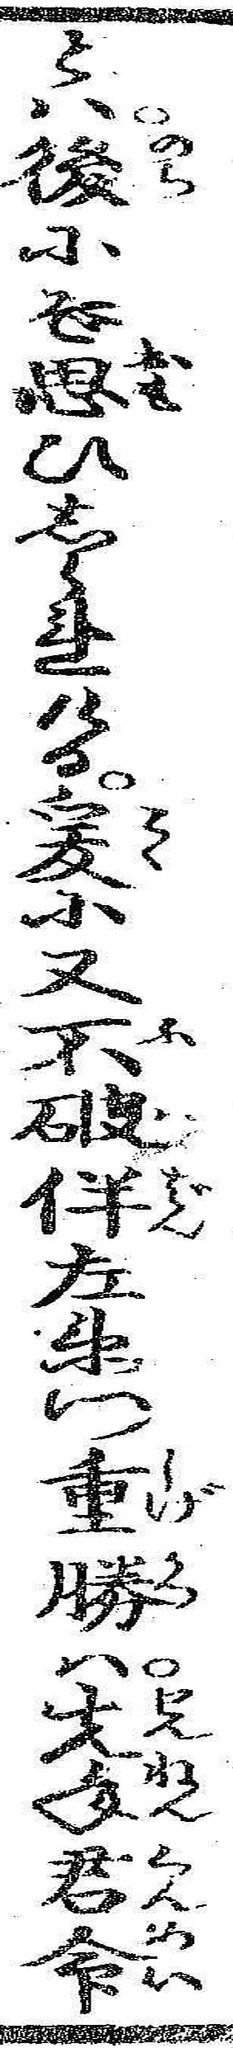とは。後にぞ思ひしられける。爰に又不破伴左衛門重勝は。先年君命
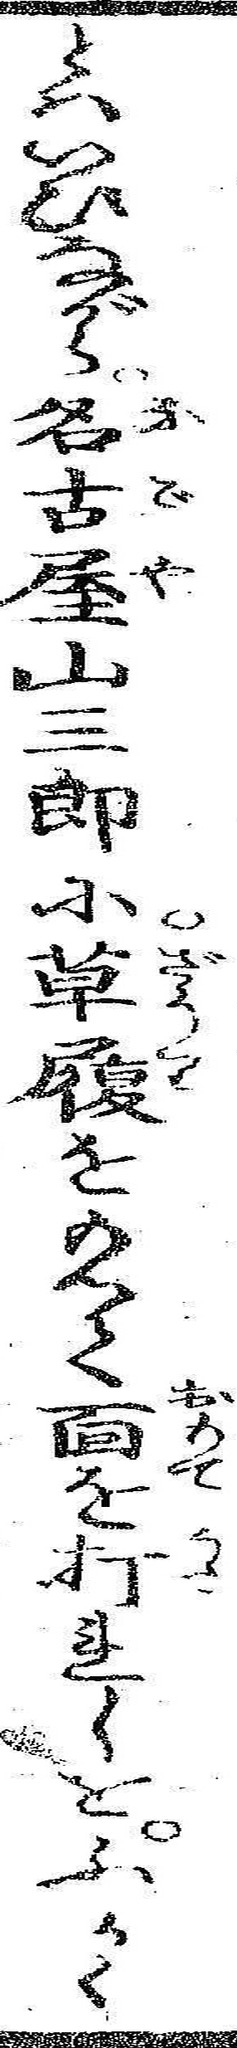とはいひながら。名古屋山三郎に。草履をもつて面を打れしを。ふかく
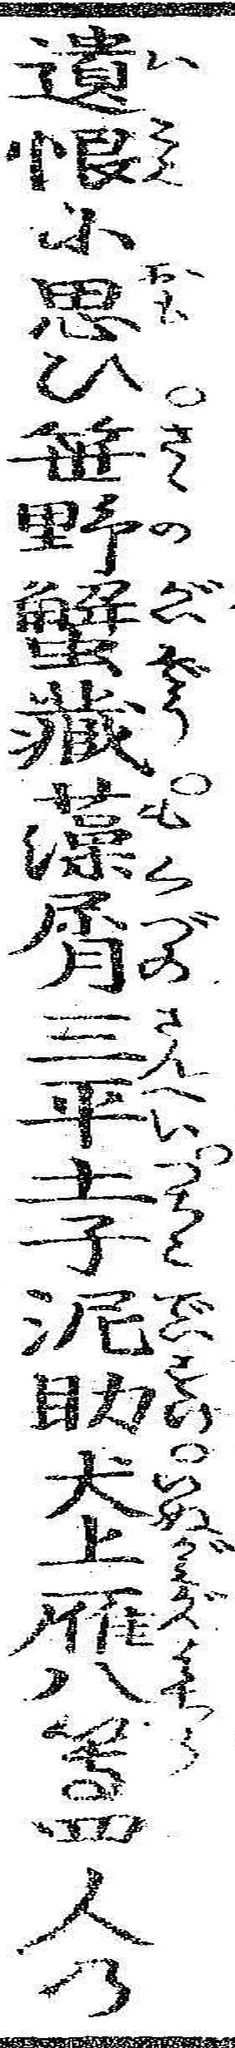遺恨に思ひ。笹野蟹蔵。藻屑三平。土子泥助。犬上雁八等四人の
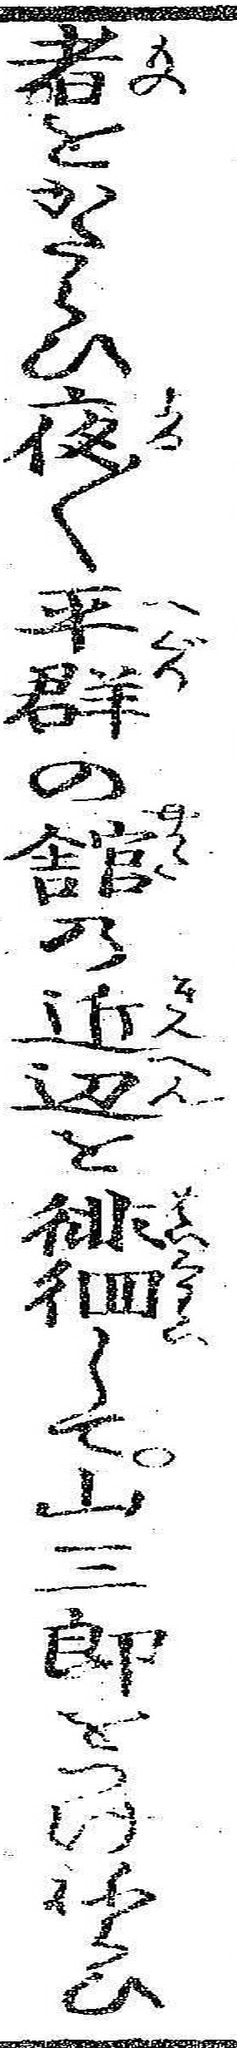者をかたらひ夜々平群の館の近辺を俳徊して。山三郎をつけねらひ
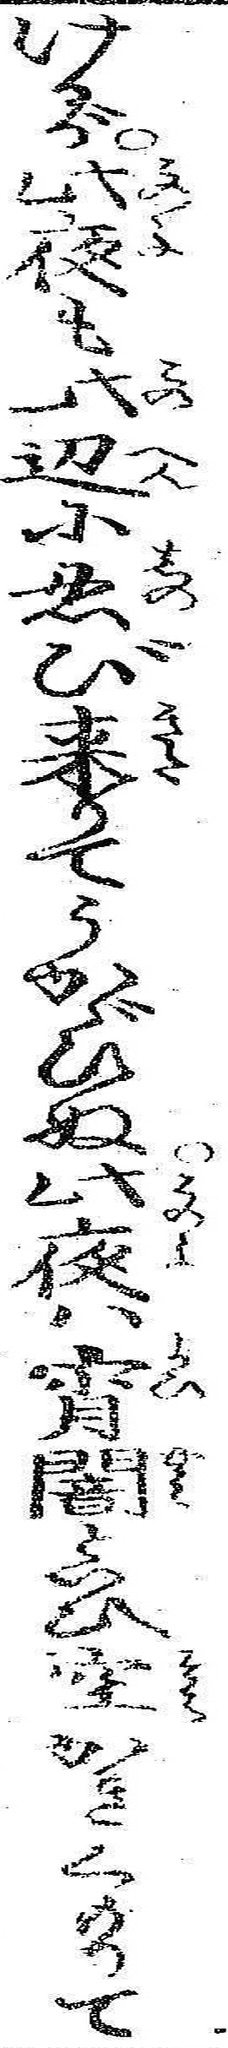けるが。此夜も此辺に忍び来りてうかゞひぬ。此夜は宵闇といひ空かきくもりて
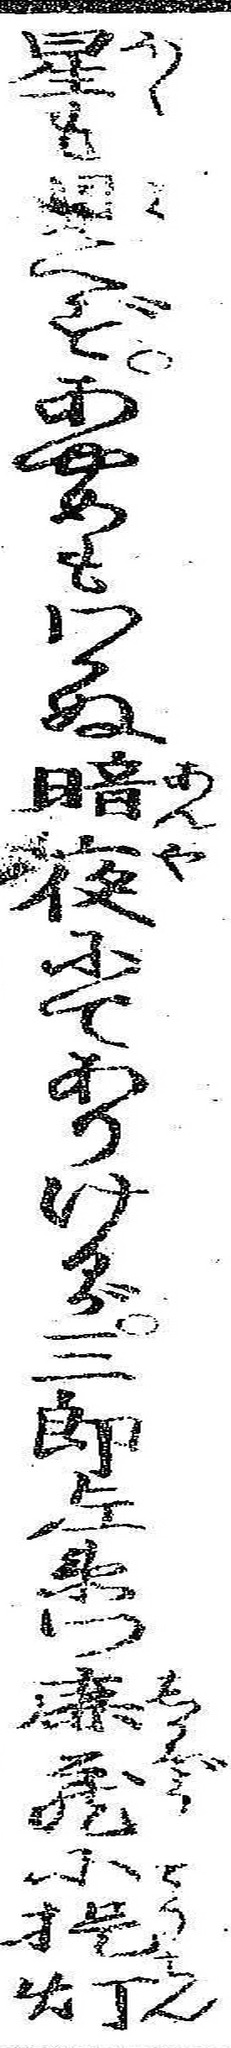星も見へず。あやめもわかぬ暗夜にてありけるが。三郎左衛門鹿蔵に提灯
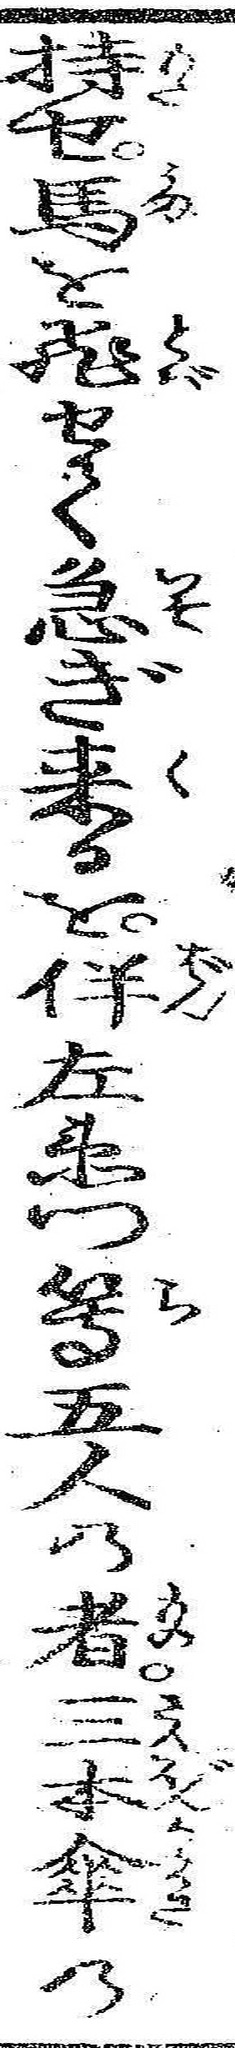持せ。馬を飛せて急ぎ来るを。伴左衛門等五人の者。三本傘の
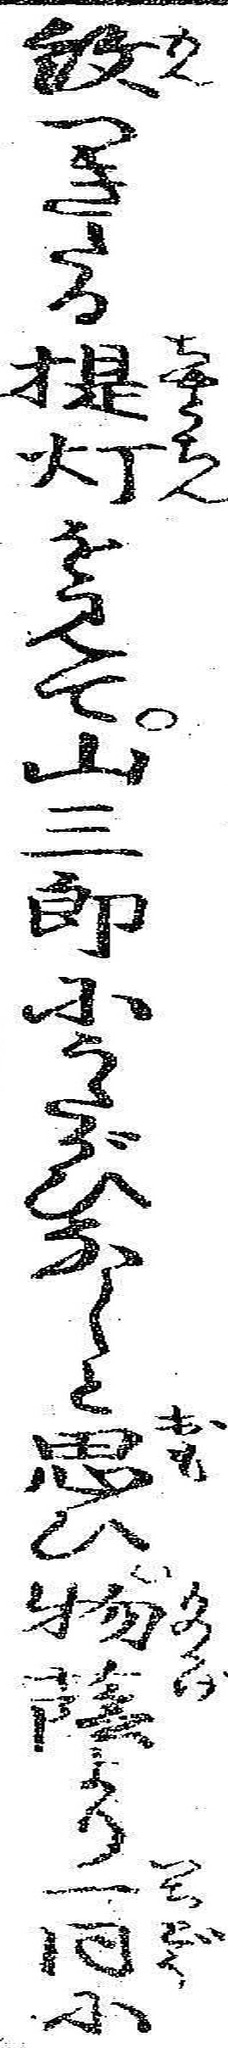紋つきたる提灯を見て。山三郎にうたがひなしと思ひ。物蔭より一同に
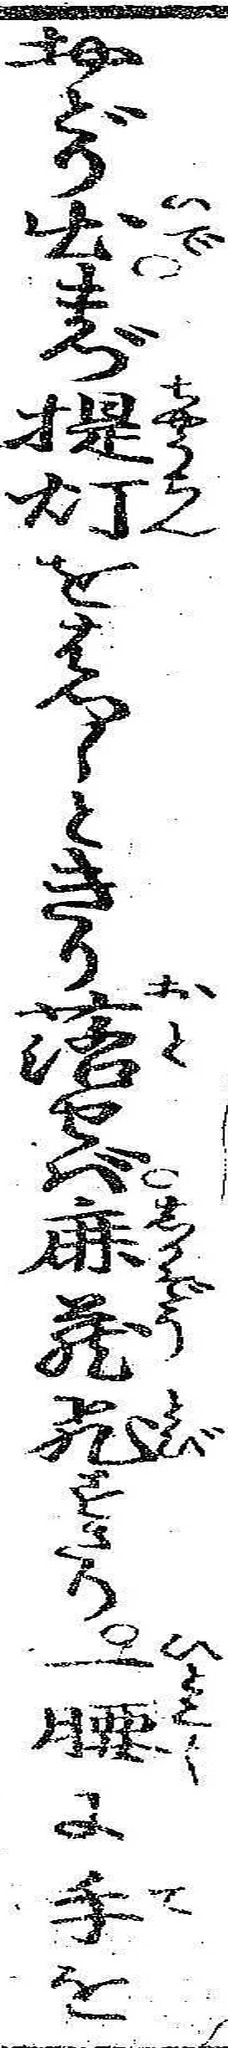おどり出。まづ提灯をはつしときり落せば。鹿蔵飛すさり。一腰に手を
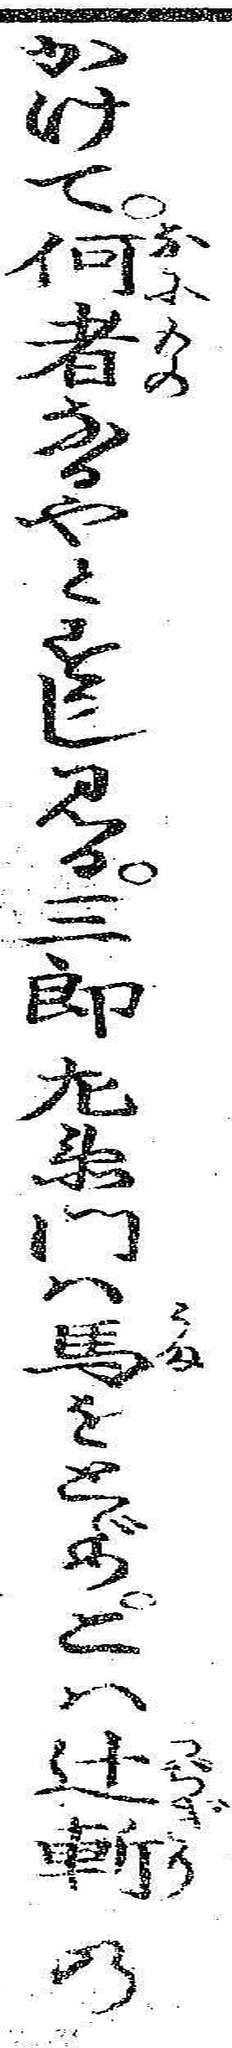かけて。何者なるやとすかし見る。三郎左衛門は馬をとゞめ。こは辻斬の
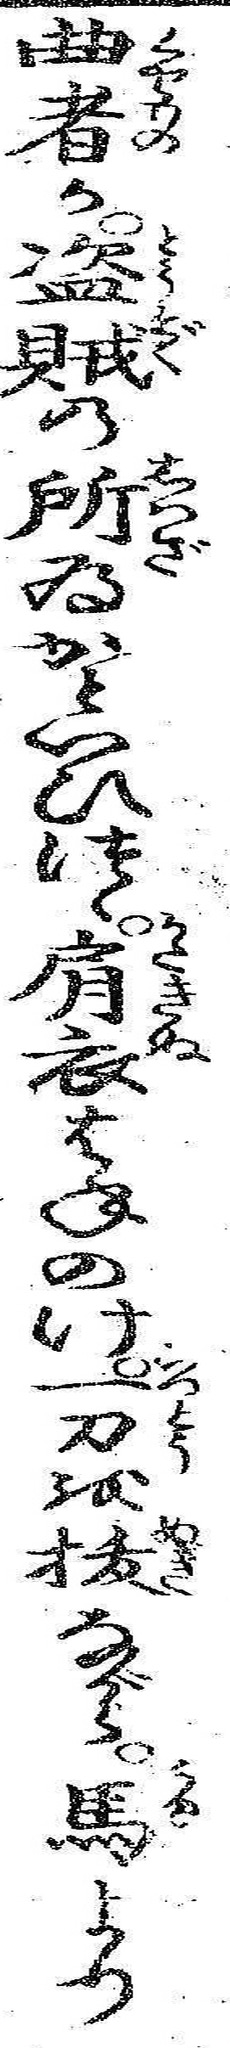曲者か。盗賊の所為かといひつゝ。肩衣はねのけ。一刀を抜ながら。馬より

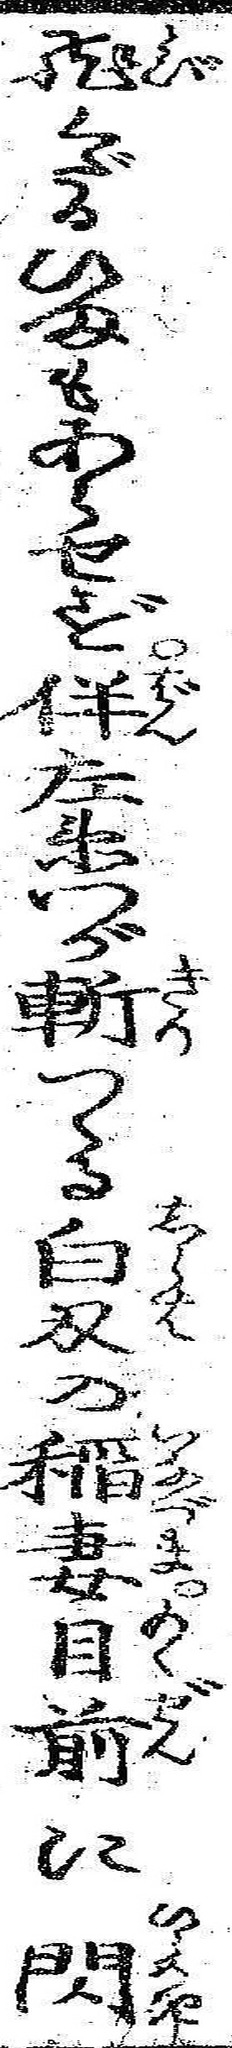飛くだるひまもあらせず。伴左衛門が斬つくる白刃の稲妻。目前に閃
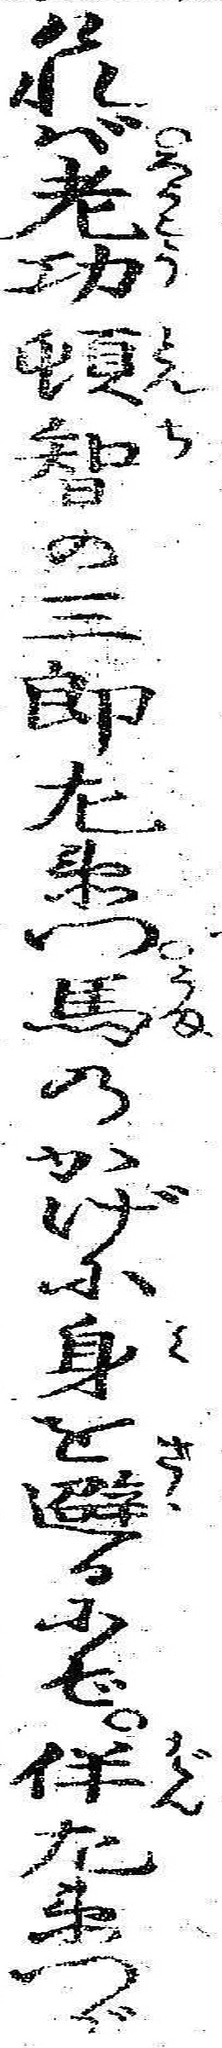ければ。老功頓智の三郎左衛門。馬のかげに身を避るにぞ。伴左衛門が
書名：昔話稲妻表紙
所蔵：国文学研究資料館
